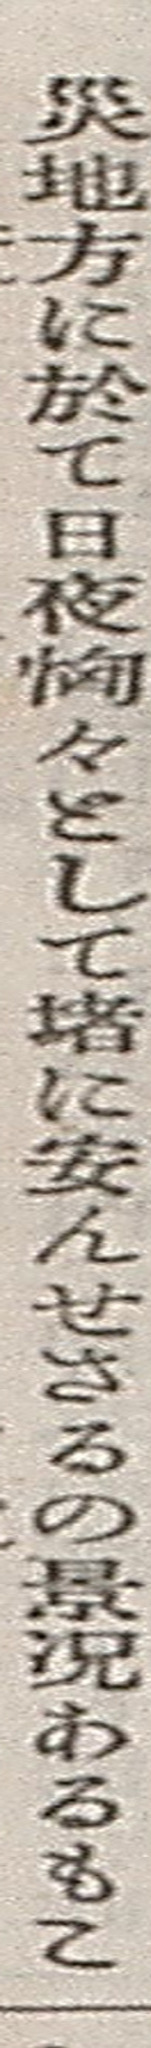災地方に於て日夜恟々として堵に安んせさるの景況あるもこ
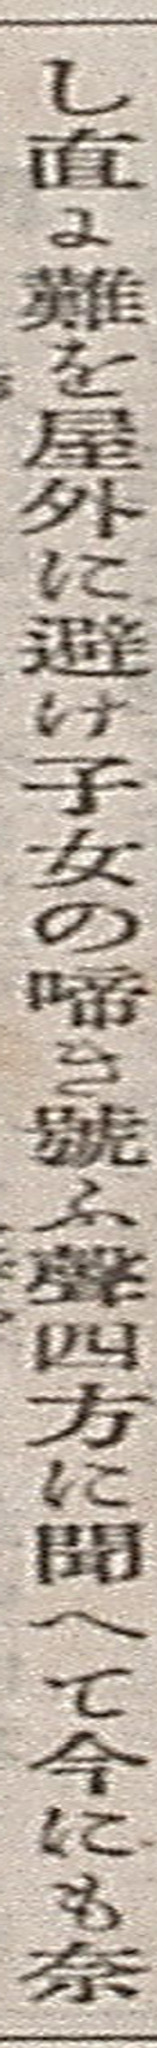し直に難を屋外に避け子女の啼き號ふ声四方に聞へて今にも奈
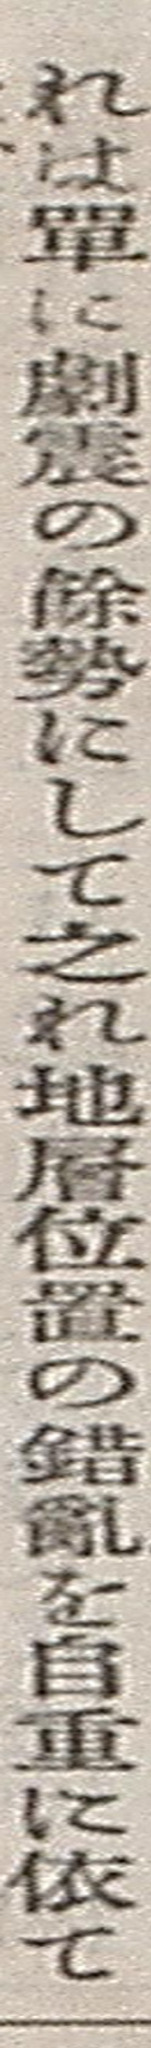れは単に劇震の余勢にして之れ地層位置の錯乱を自重に依て
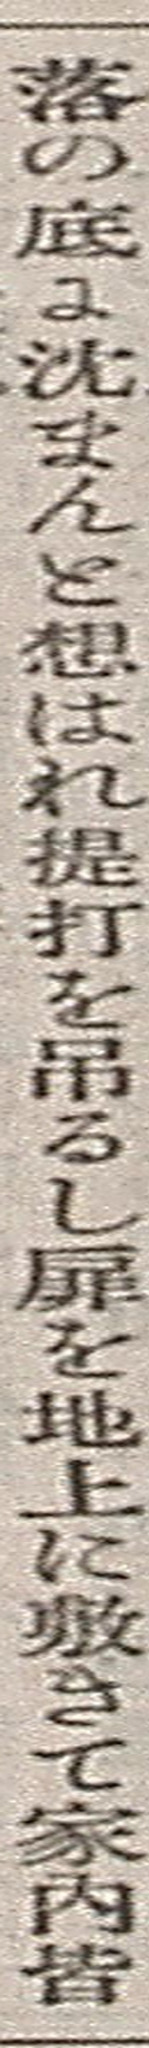落の底に沈まんと想はれ提灯を吊るし扉を地上に敷きて家内皆
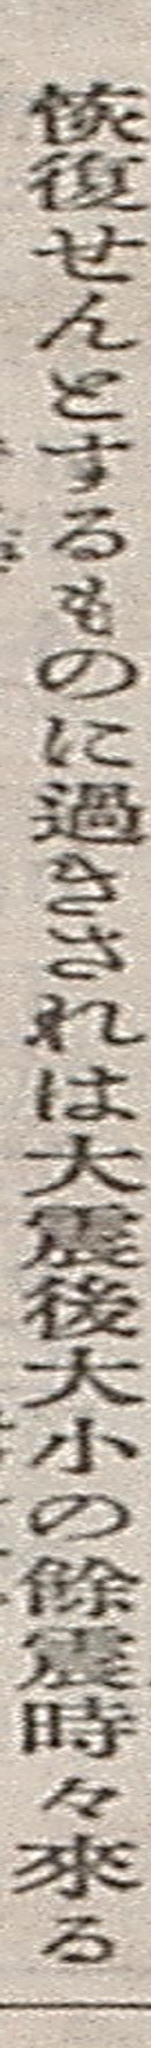恢復せんとするものに過きされは大震後大小の余震時々来る
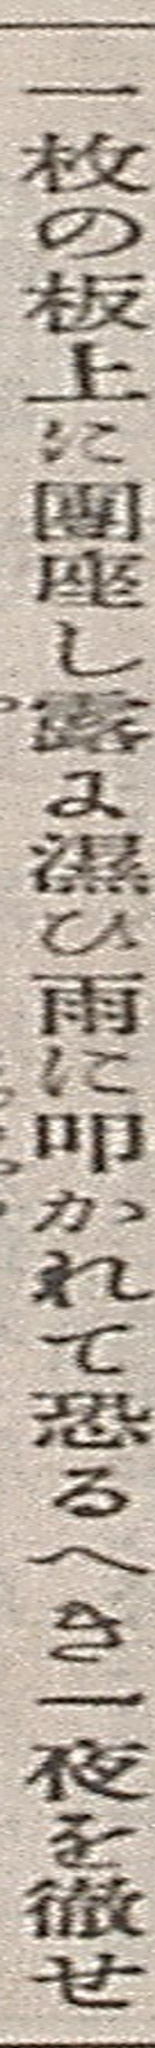一枚の板上に団座し露に湿ひ雨に叩かれて恐るへき一夜を徹せ
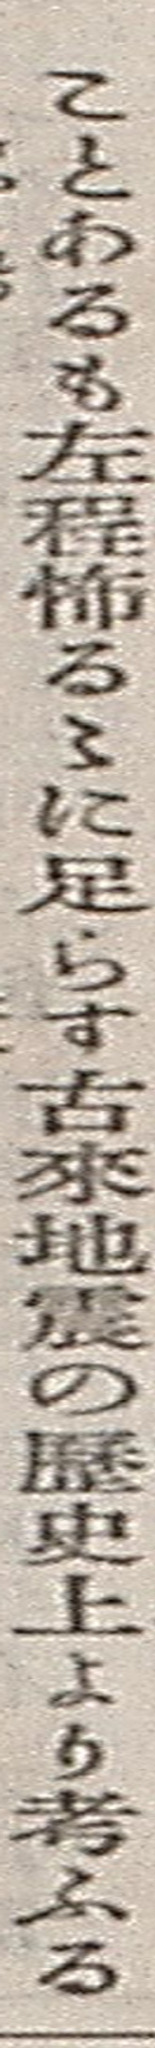こともあるも左程怖るゝに足らす古来地震の歴史上より考ふる
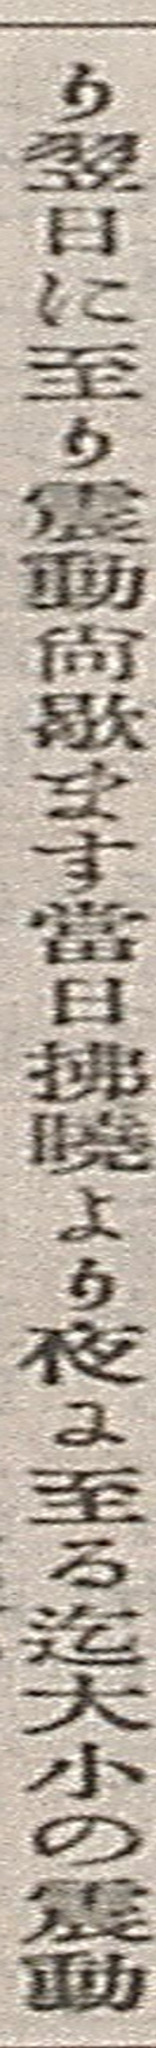り翌日に至り震動尚歇ます当日払暁より夜に至る迄大小の震動
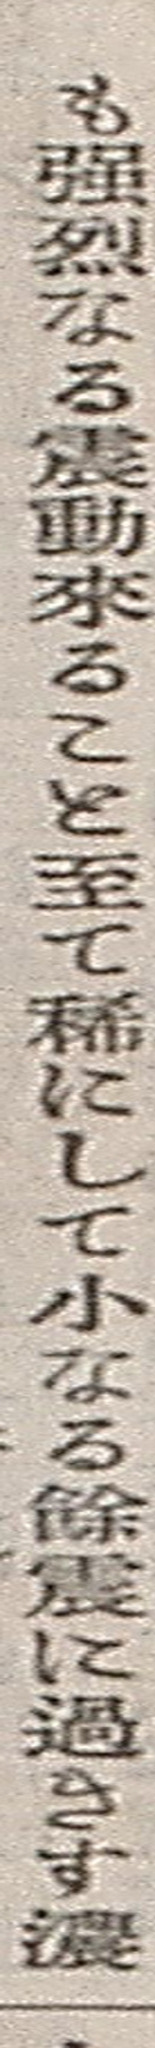も強烈なる震動来ること至て稀にして小なる余震に過きす濃
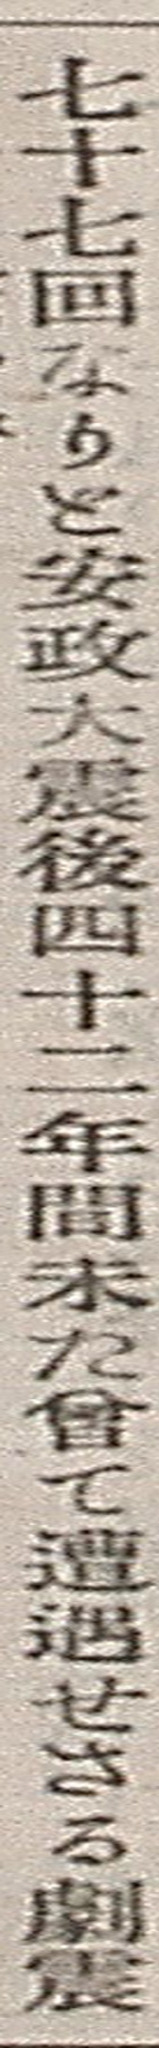七十七回なりと安政大地震後四十二年間未た曾て遭遇せさる劇震
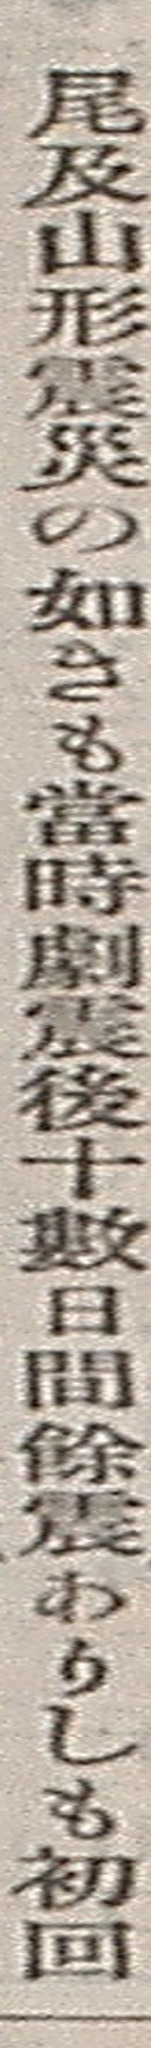尾及山形震災の如きも当時劇震後十数日間余震ありしも初回
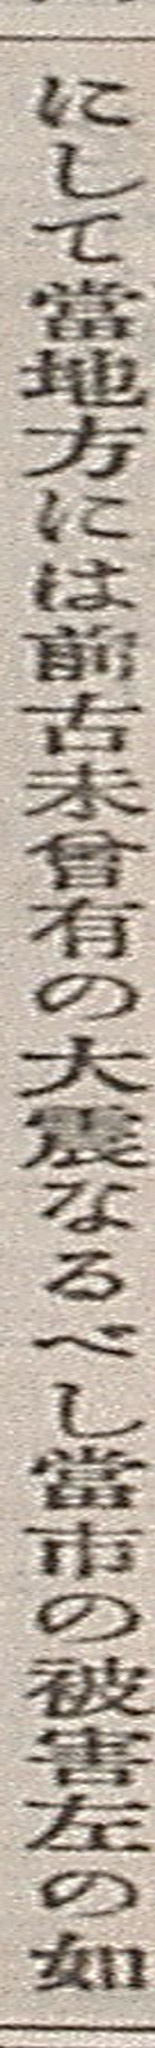にして当地方には前古未曾有の大震なるべし当市の被害左の如
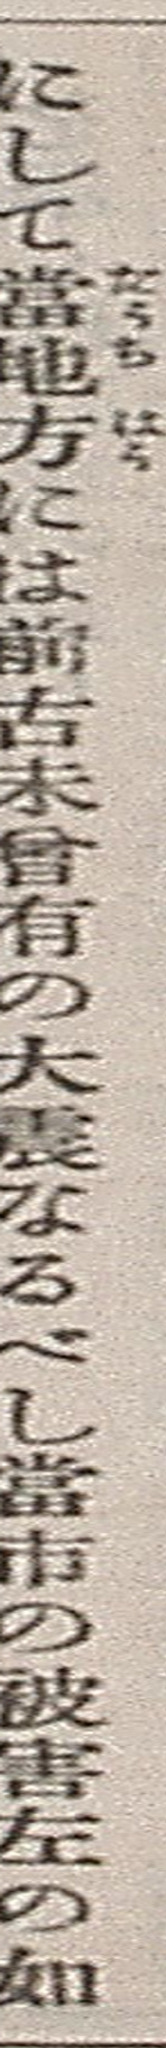にして当地方には前古未曾有の大震なるべし当市の被害左の如
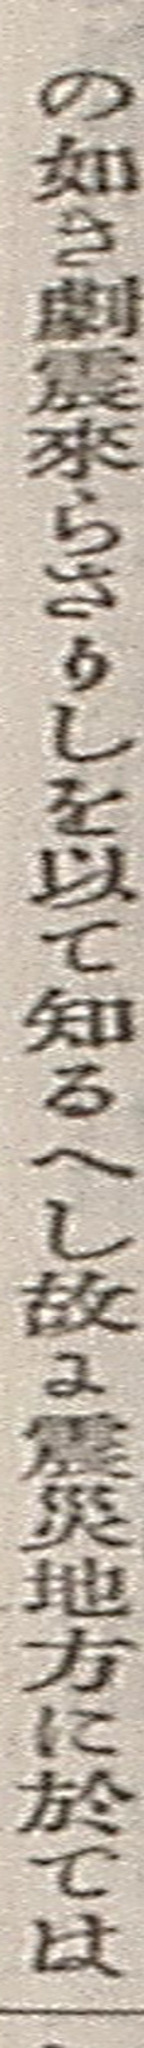の如き劇震来らさりしを以て知るへし故に震災地方に於ては

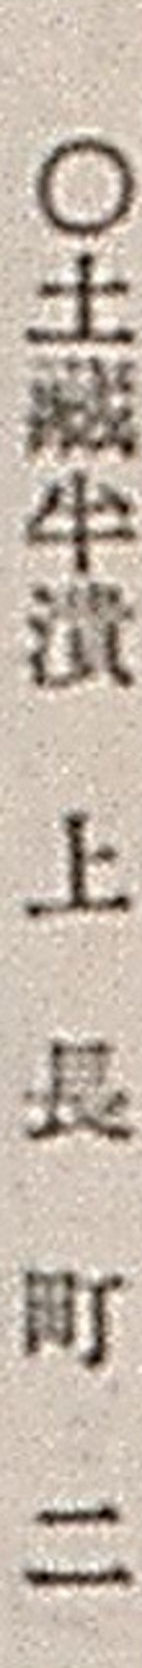〇土蔵半潰上長町二棟
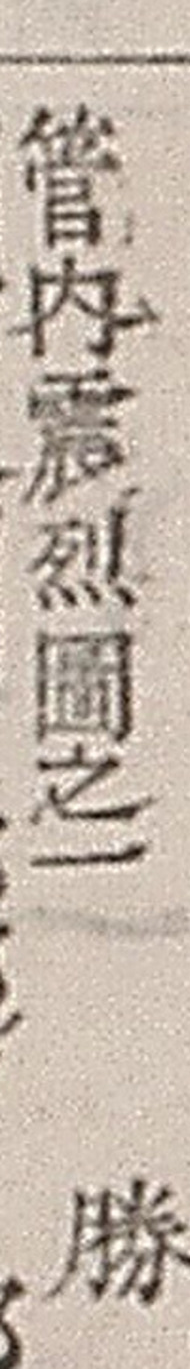管内震烈図之一
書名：風俗畫報臨時増刊第百二十四號　洪水地震被害録（上）
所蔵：東京大学地震研究所図書室 Earthquake Research Institute Library, The University of Tokyo, JAPAN
